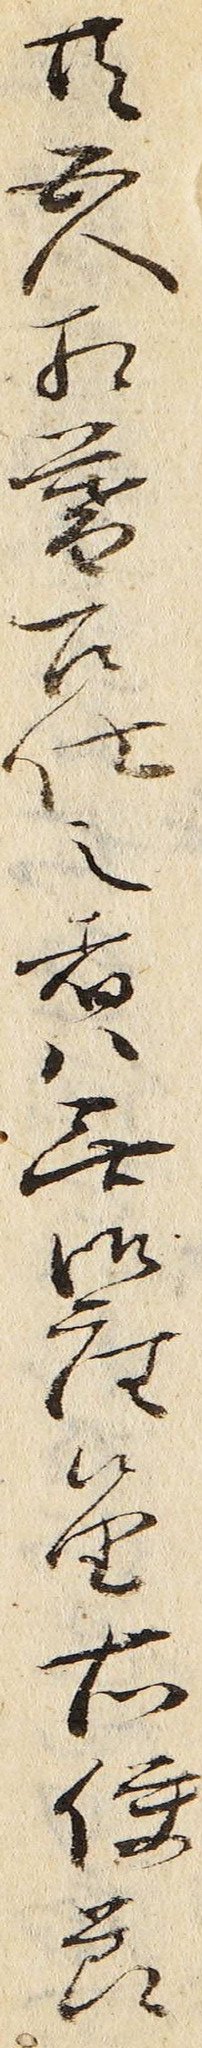共五人相暮召仕之者は無御座候由右使節
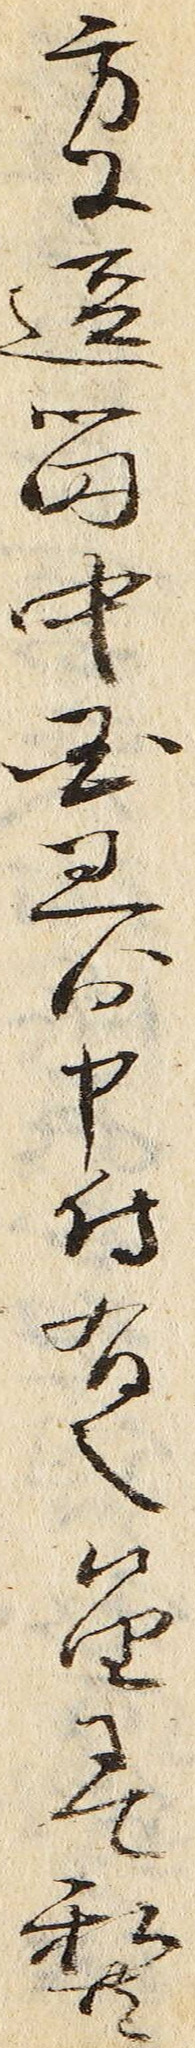方に逗留中国王ゟ申付有之候由にて私共
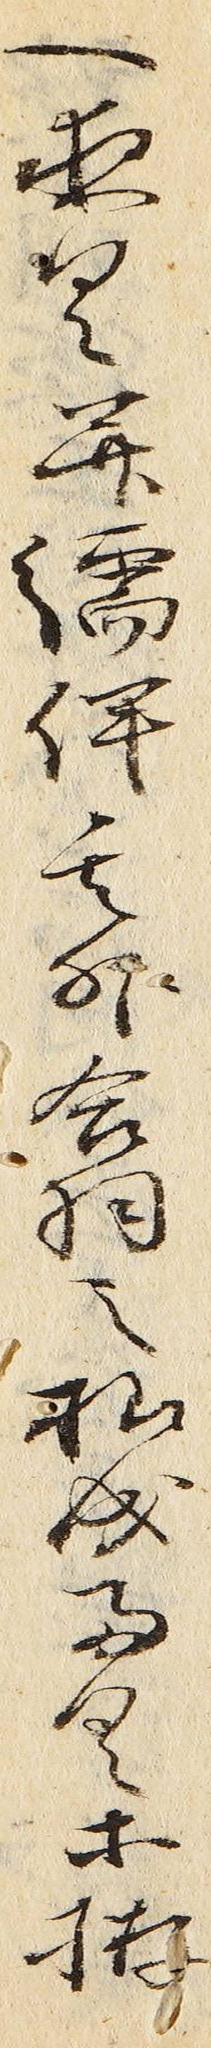へ夜具并襦袢其外合羽之様成雨具等拵
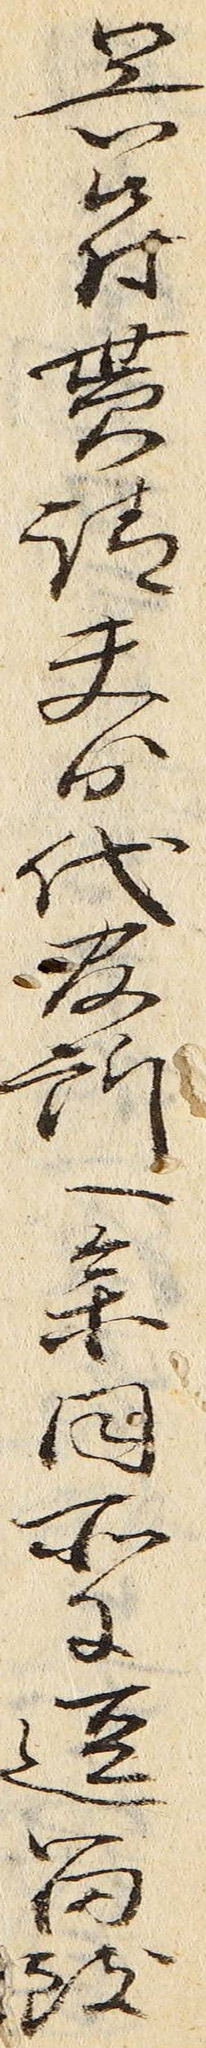呉候付貰請夫ゟ代官所へ参同所に逗留致
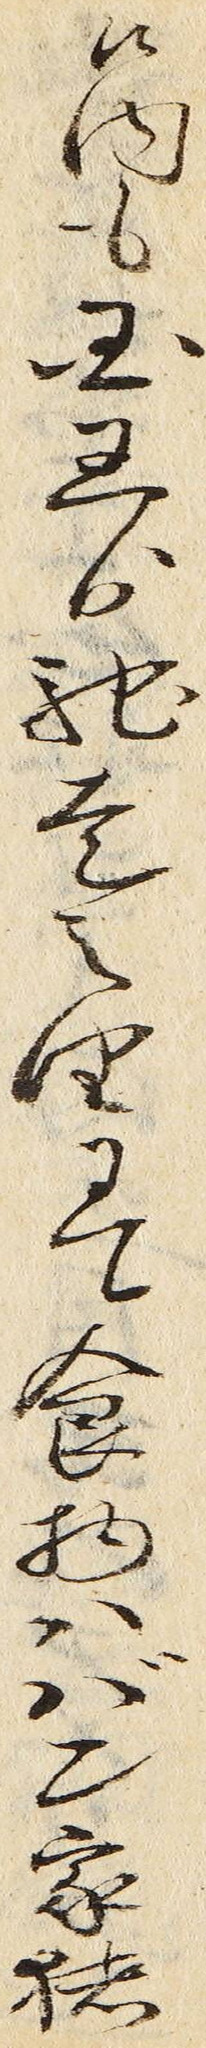候内も国王ゟ馳走之由にて食物はバン家猪
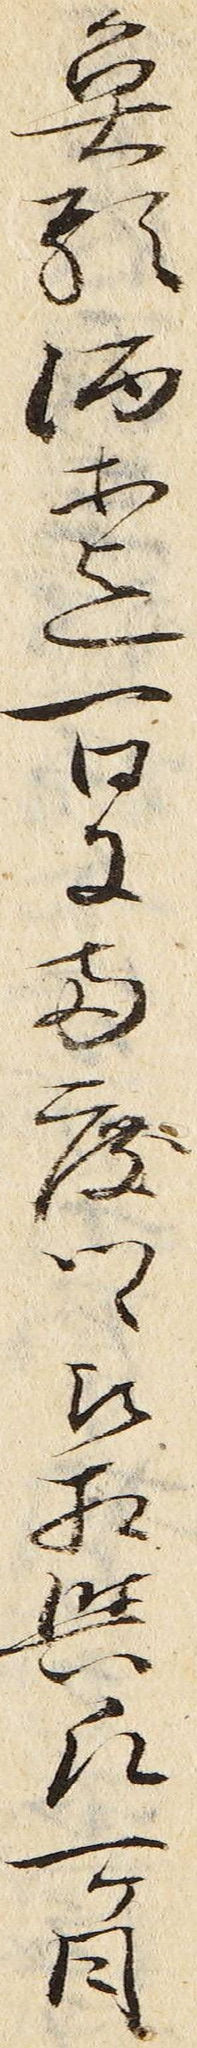魚類酒等迄一日に両度ツヽ被相与凡一ヶ月
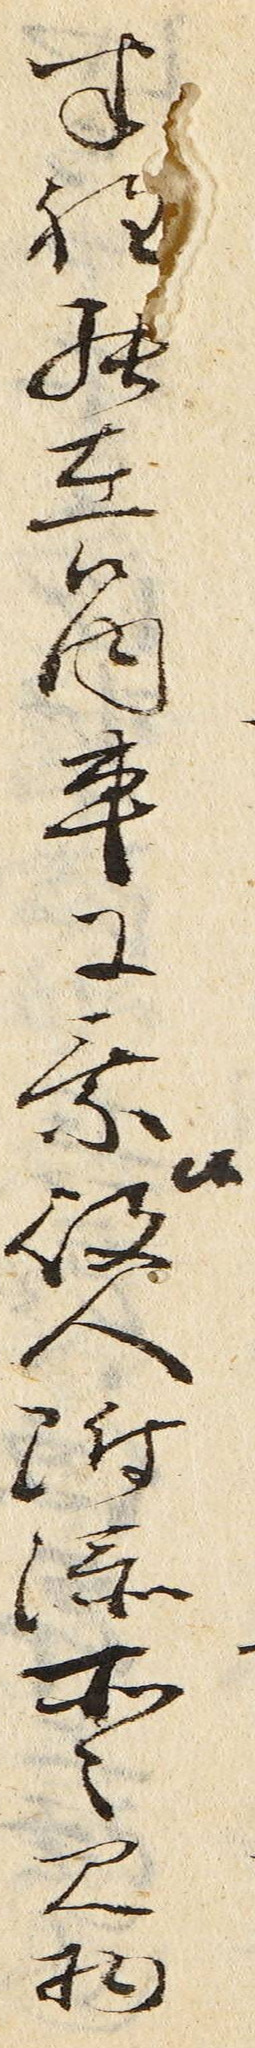半程罷在候内車に乗候役人附添所々見物
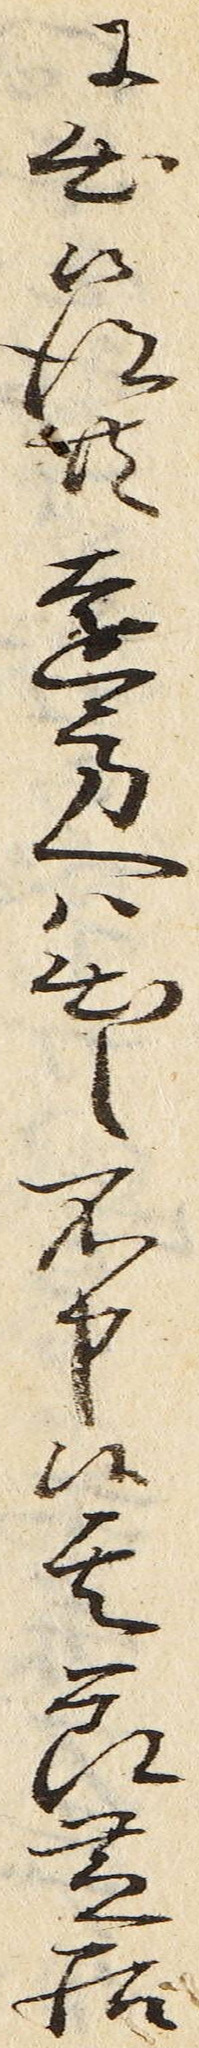に出候得共遠方へは出し不申候其節芝居
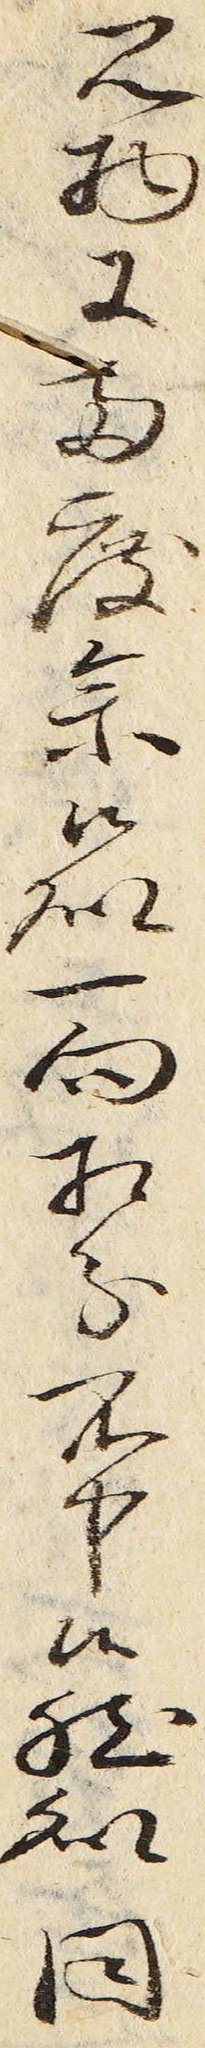見物に両度参候処一向相分不申候然処同
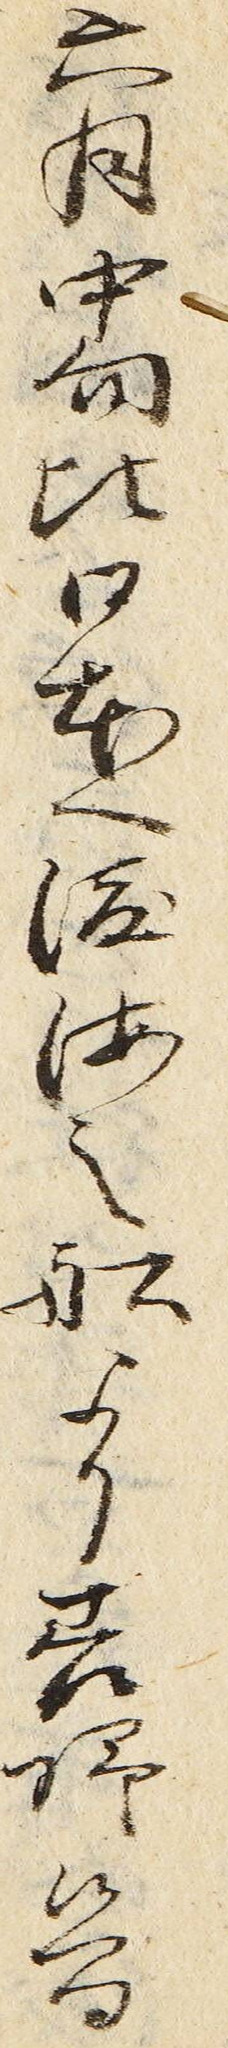六月中旬比日本へ渡海之船より差帰候間
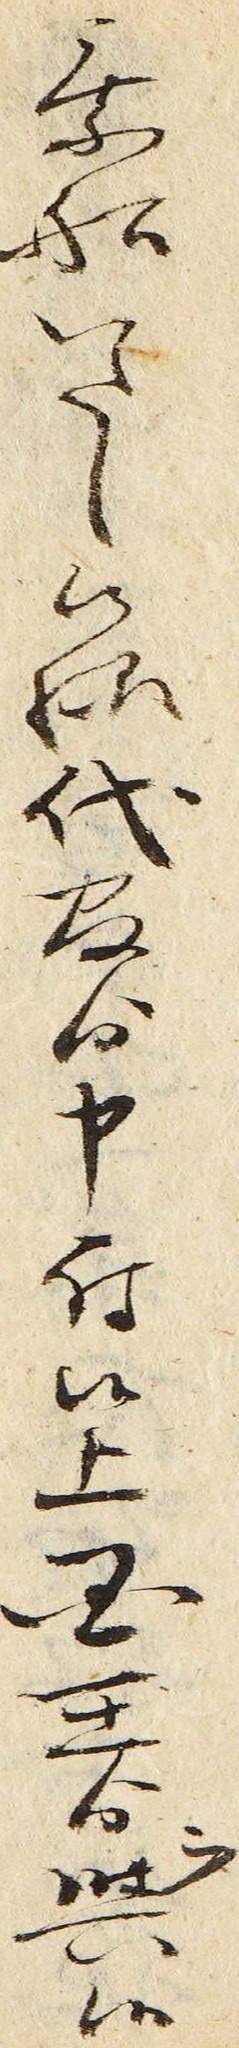乗船いたし候様代官ゟ申付候上国王ゟ被与候
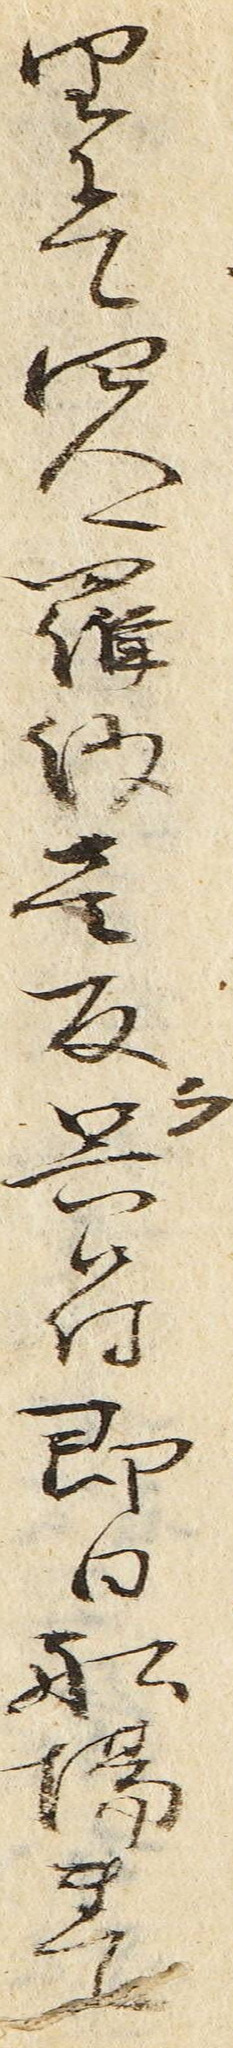由にて四人へ羅紗壱反被呉候付即日船場まて
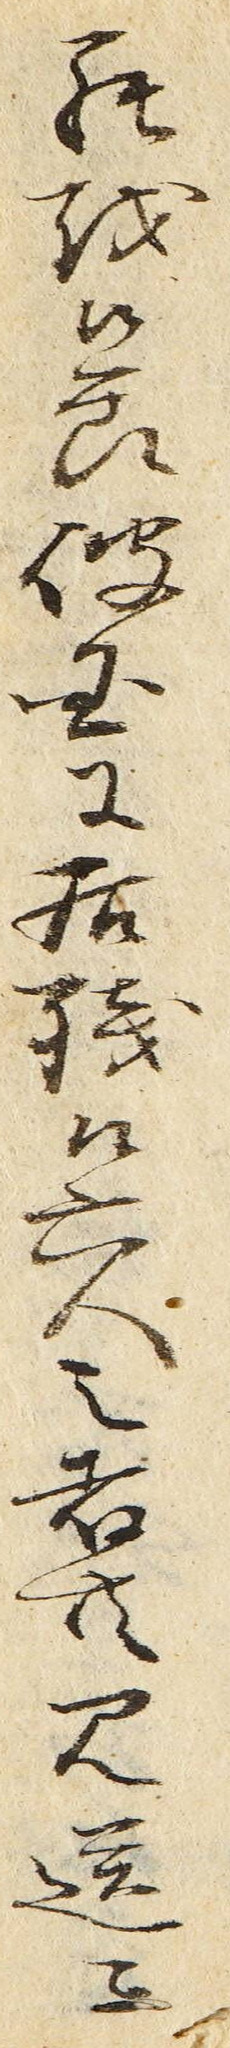罷越候節彼国に居残候六人之者共見送に

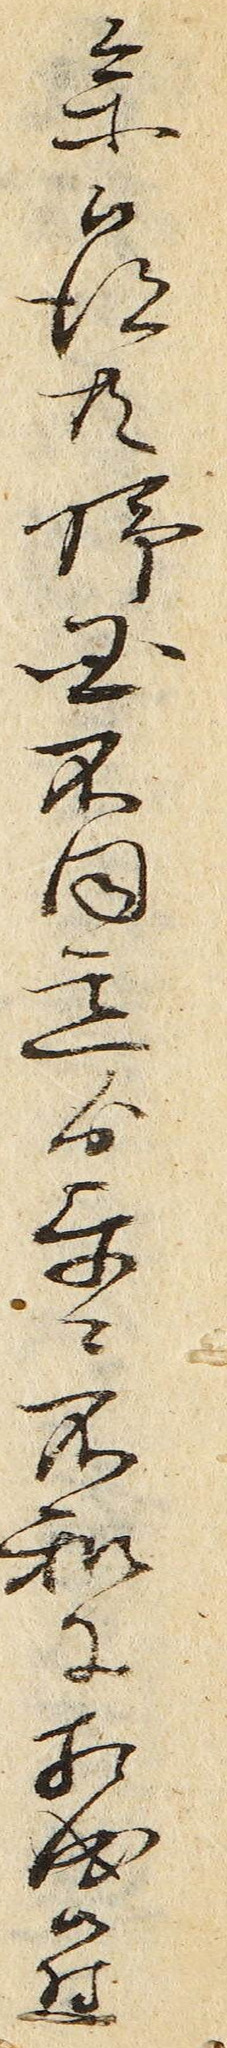参候得共帰国不同意ゟ互に不和に相成候付
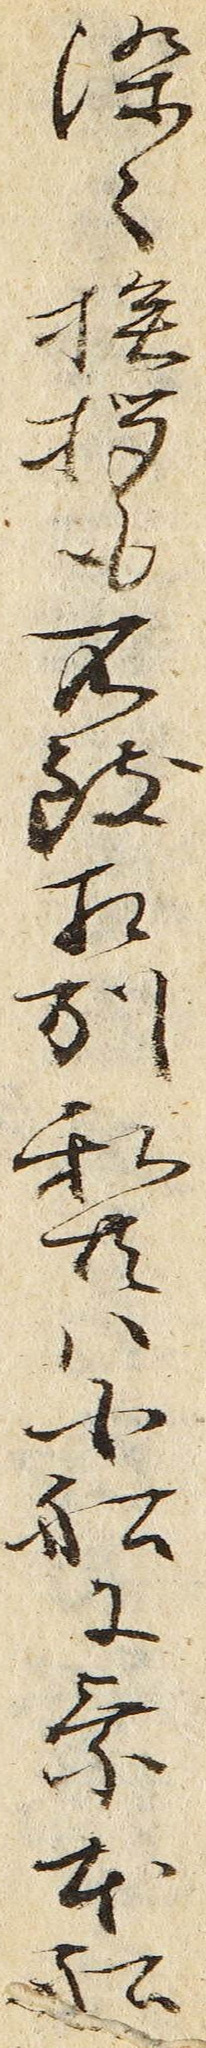深く挨拶も不致相別私共は小船に乗本船
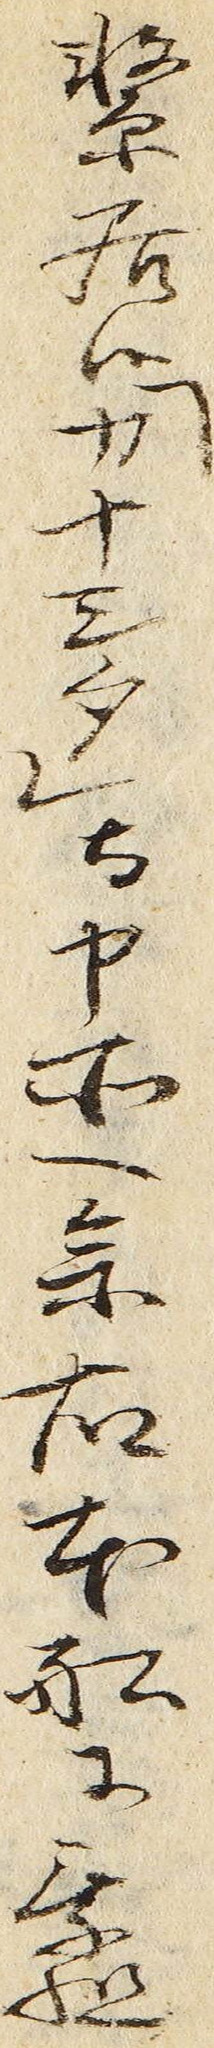繋居候「カナミタ」と申所へ参右本船に乗組
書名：漂民後記
